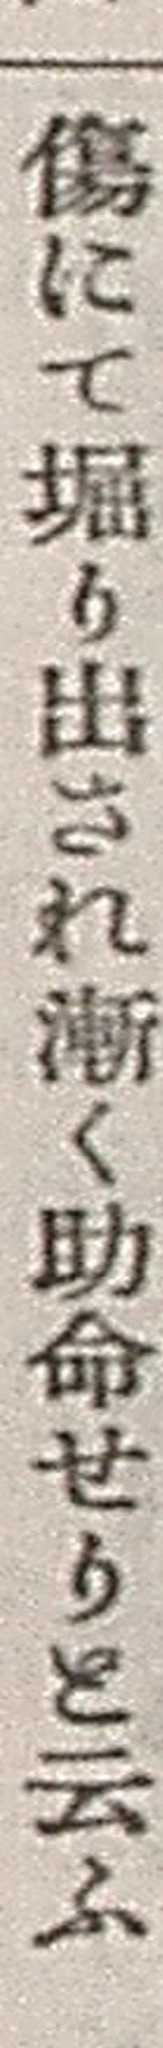傷にて堀り出され漸く助命せりと云ふ
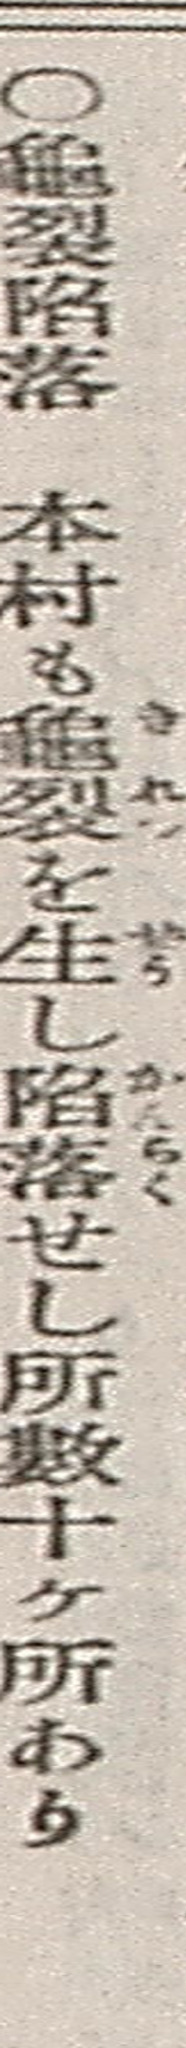〇亀裂陥落本村も亀裂を生し陥落せし所数十ケ所あり
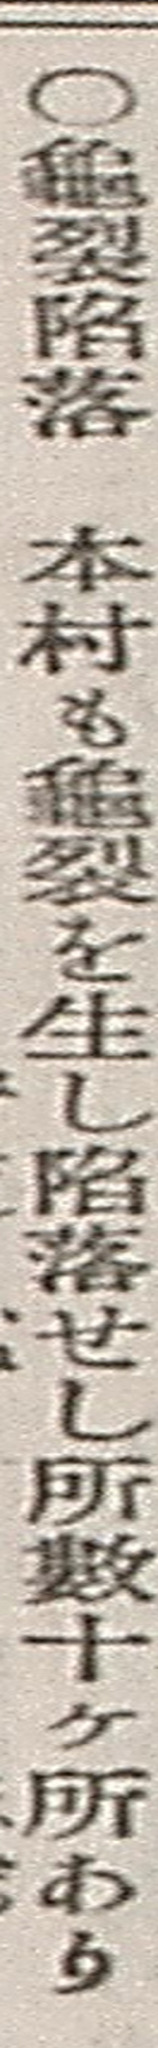〇亀裂陥落本村も亀裂を生し陥落せし所数十ケ所あり
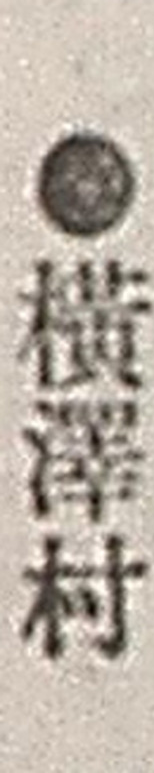●横堀村
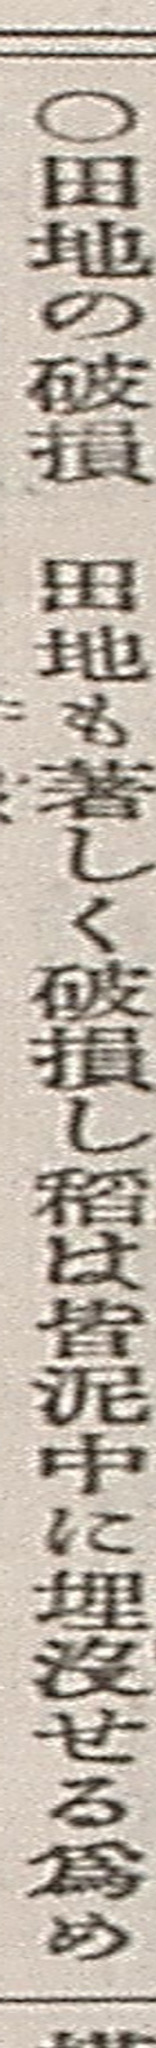〇田地の破損田地も著しく破損し稲は皆泥中に埋没せる為め
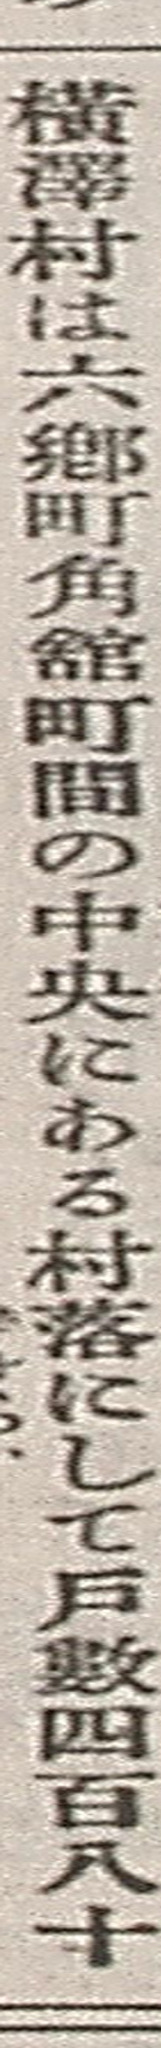横沢村は六郷町角館町間の中央にある村落にして戸数四百八十
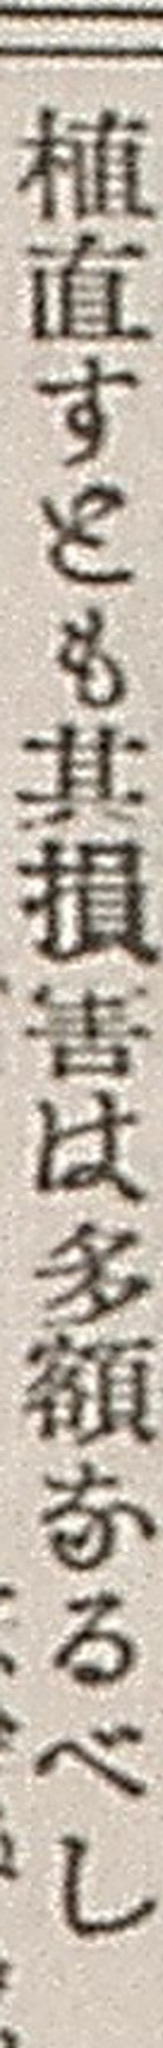植直すとも其損害は多額なるべし
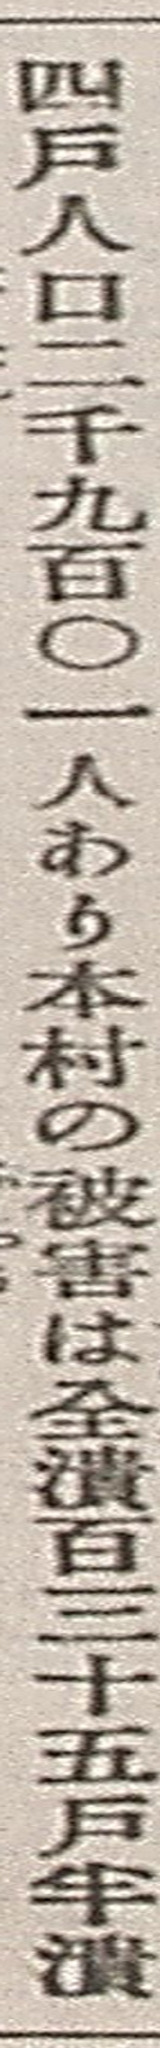四戸人口二千九百〇一人あり本村の被害は全潰百三十五戸半潰
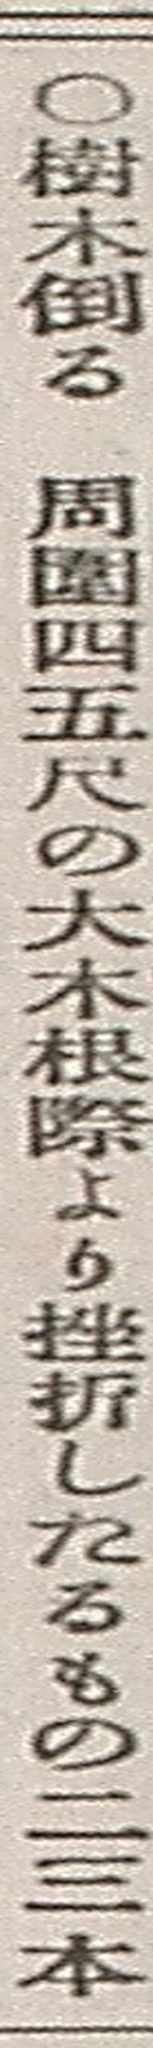〇植木倒る周囲四五尺の大木根際より挫折したるもの二三本
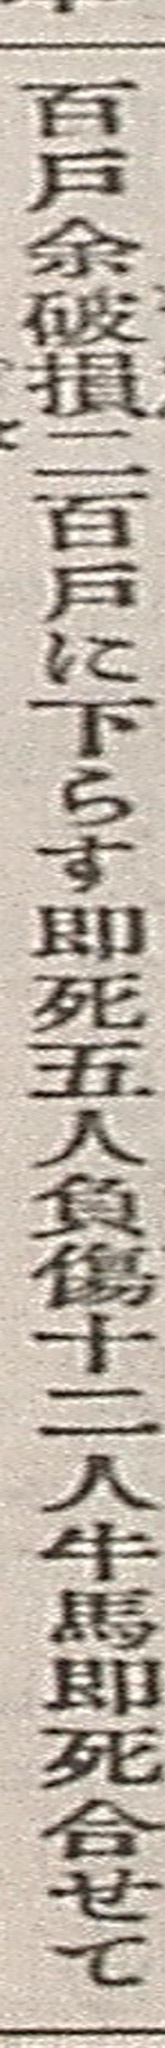百戸余破損二百戸に下らす即死五人負傷十二人牛馬即死合せて
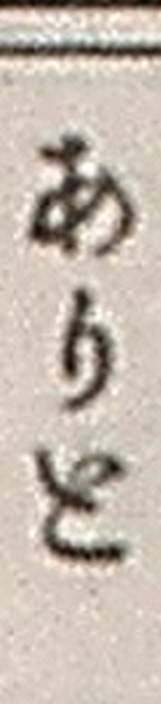ありと
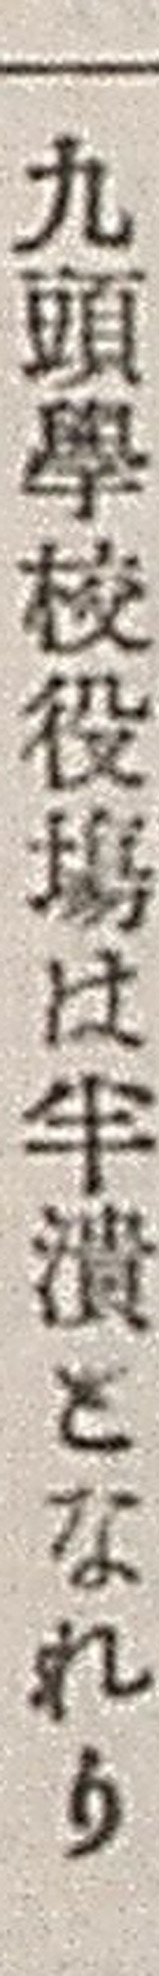九頭学校役場は半潰となれり
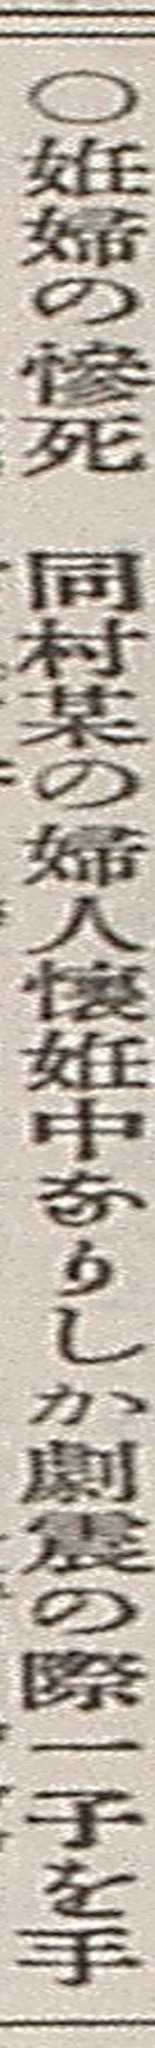〇妊婦の惨死同村某の婦人懐妊中なりしか劇震の際一子を手
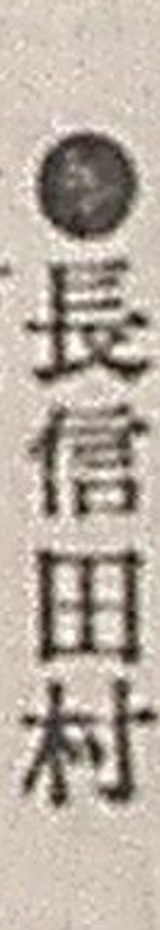●長信田村
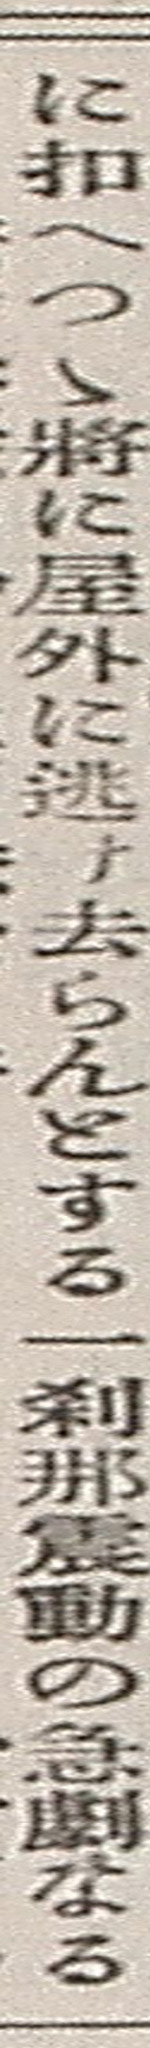に扣へつゝ将に屋外に逃け去らんとする一刹那震動の急劇なる
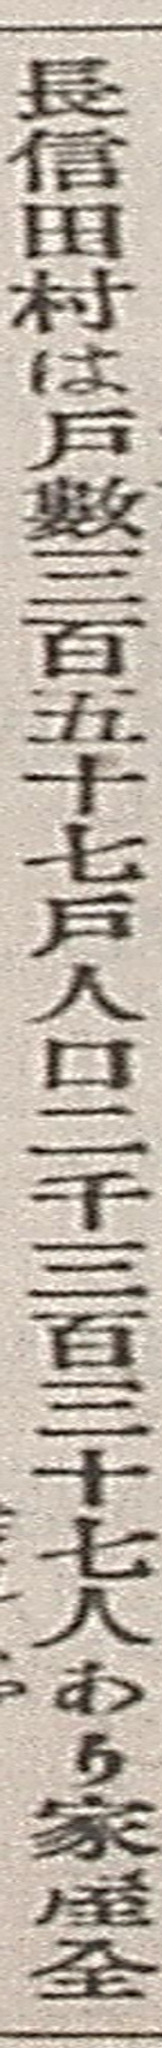長信田村は戸数三百五十七戸人口二千三百三十七人あり家屋全
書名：風俗畫報臨時増刊第百二十四號　洪水地震被害録（上）
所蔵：東京大学地震研究所図書室 Earthquake Research Institute Library, The University of Tokyo, JAPAN
